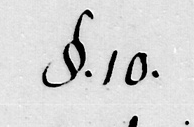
§. 10.
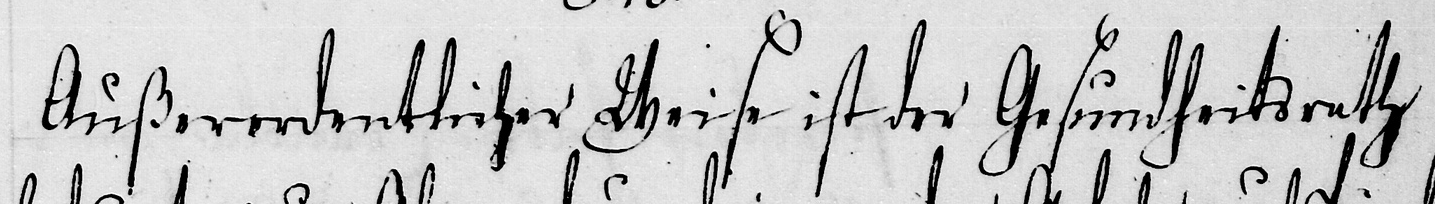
Außerordentlicher Weise ist der Gesundheitsrath
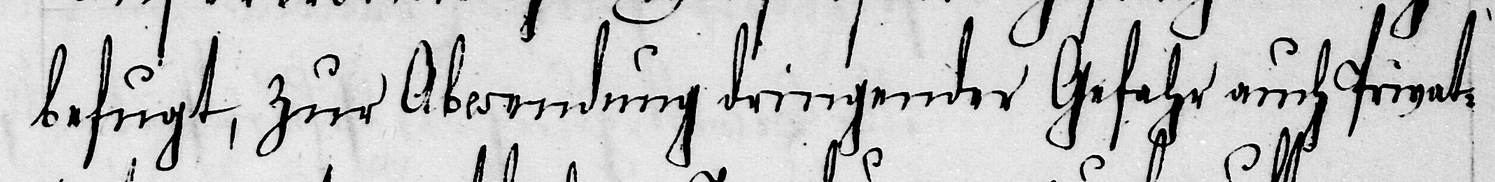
befugt, zur Abwendung dringender Gefahr auch Privat¬
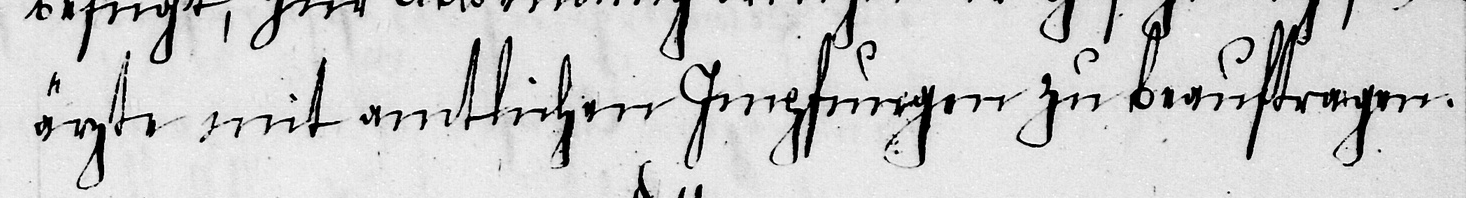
ärzte mit amtlichen Impfungen zu beauftragen.
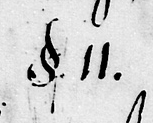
§. 11.
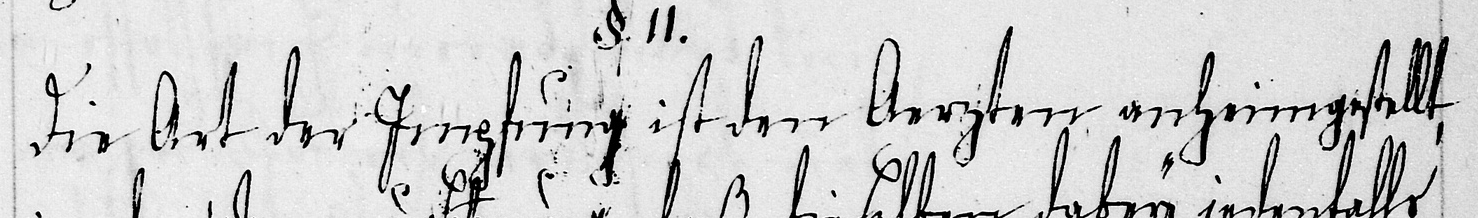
Die Art der Impfung ist den Aerzten anheimgestell¬
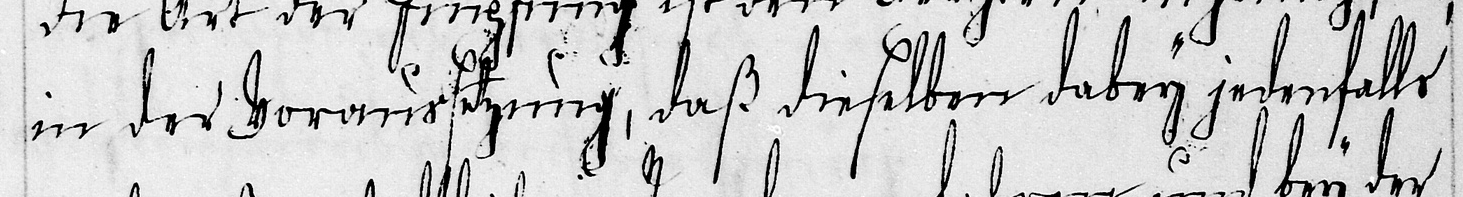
in der Voraussetzung, daß dieselben dabey jedenfalls
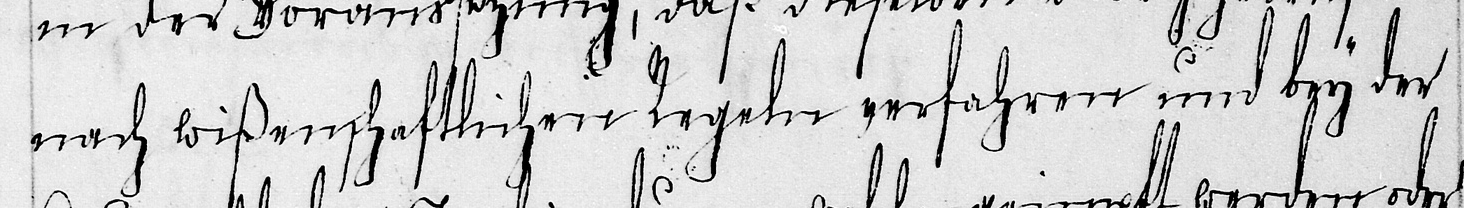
nach wißenschaftlichen Regeln verfahren und bey der
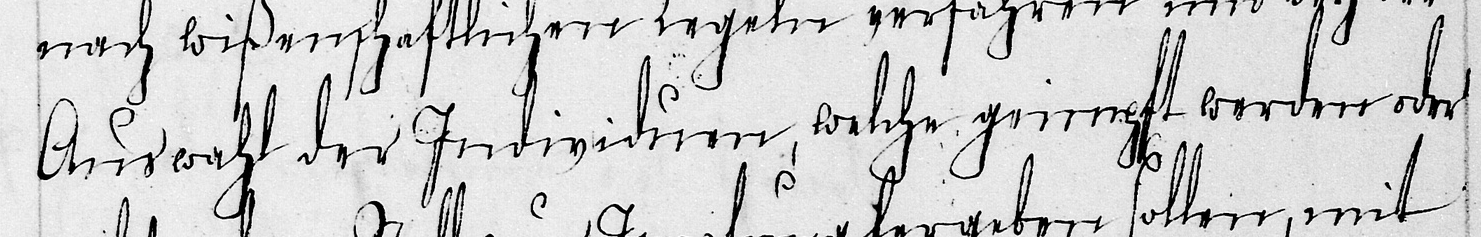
Auswahl der Individuen, welche geimpft werden oder
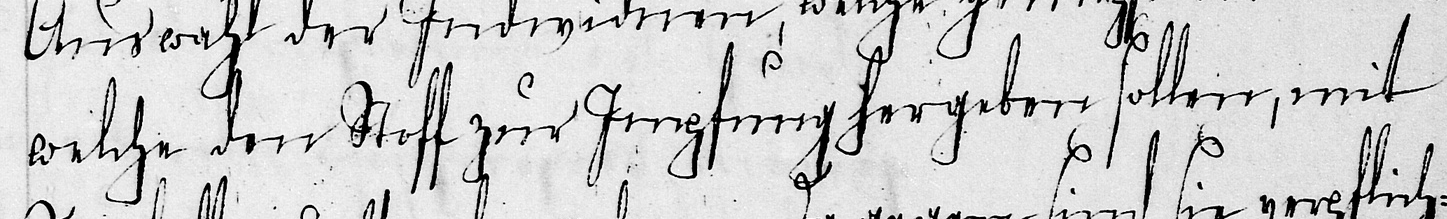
welche den Stoff zur Impfung hergeben sollen, mit
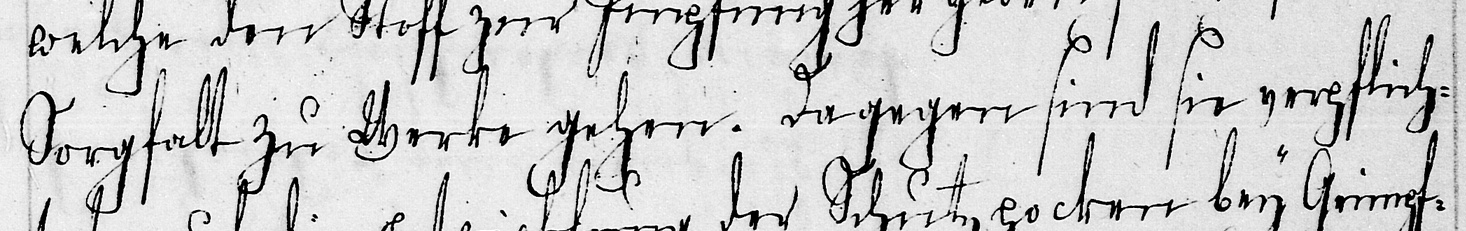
Sorgfalt zu Werke gehen. Dagegen sind sie verpflich¬
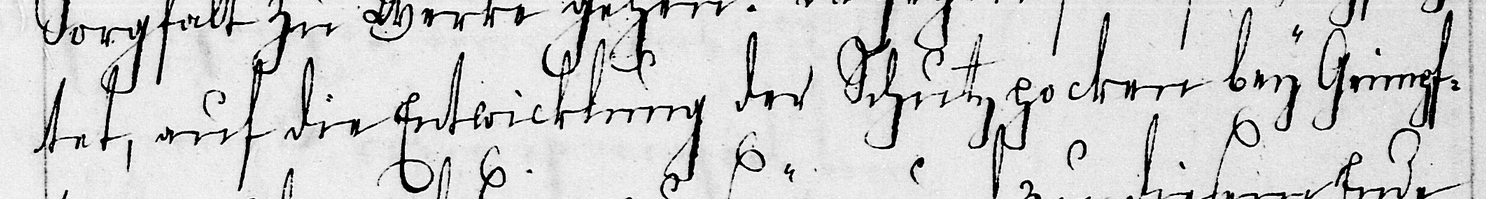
tet, auf die Entwicklung der Schutzpocken bey Geimpf¬
